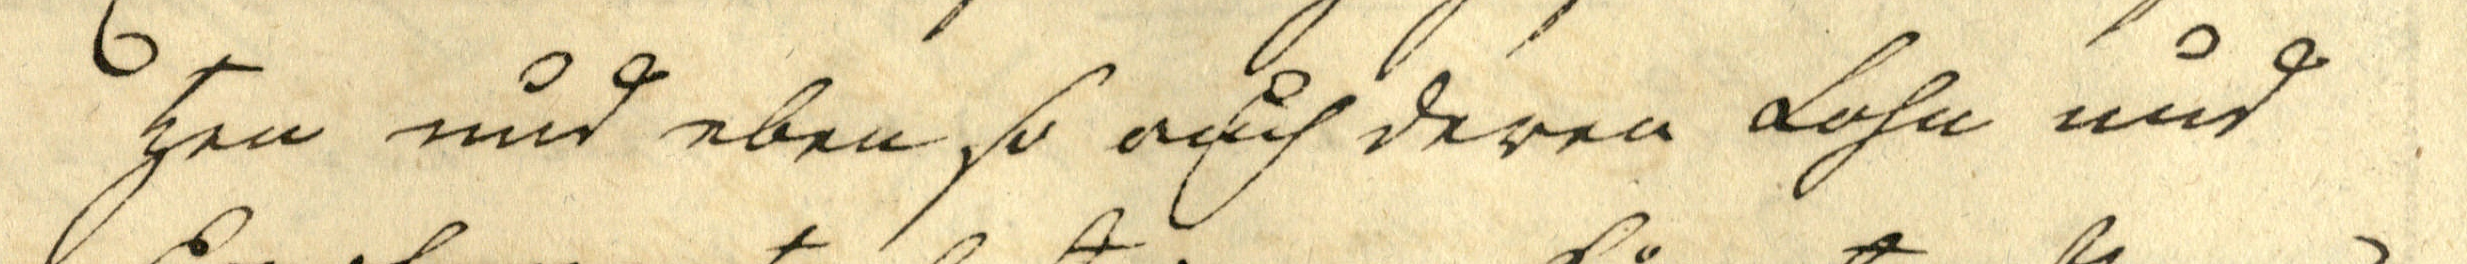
tzen und eben so auch deren Lohn und
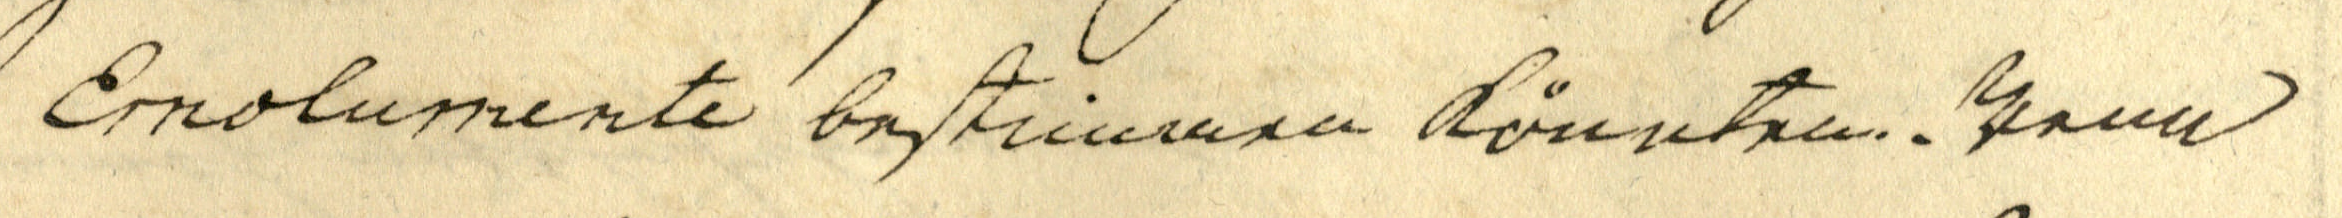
Emolumente bestimmen könnten. Wenn
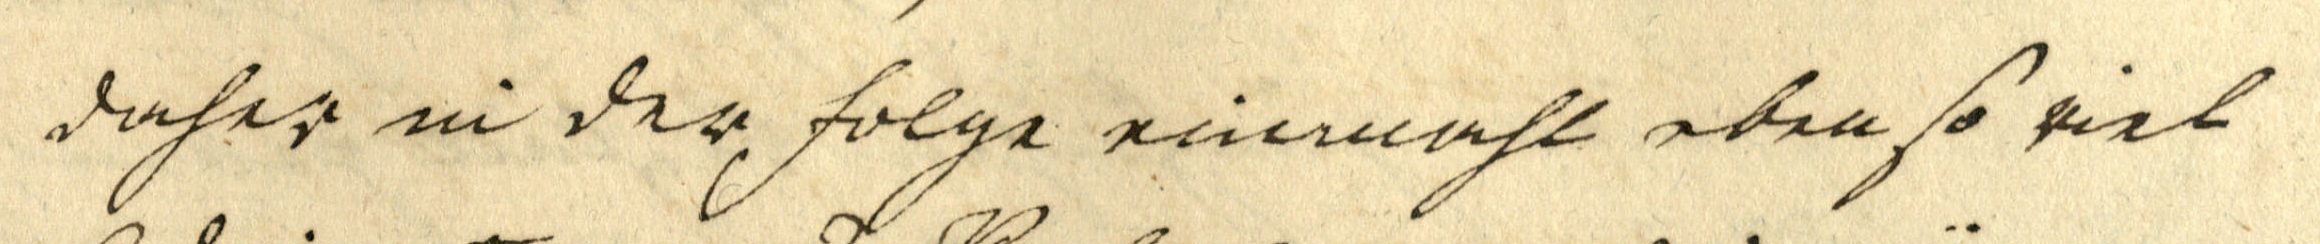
daher in der Folge einmahl eben so viel
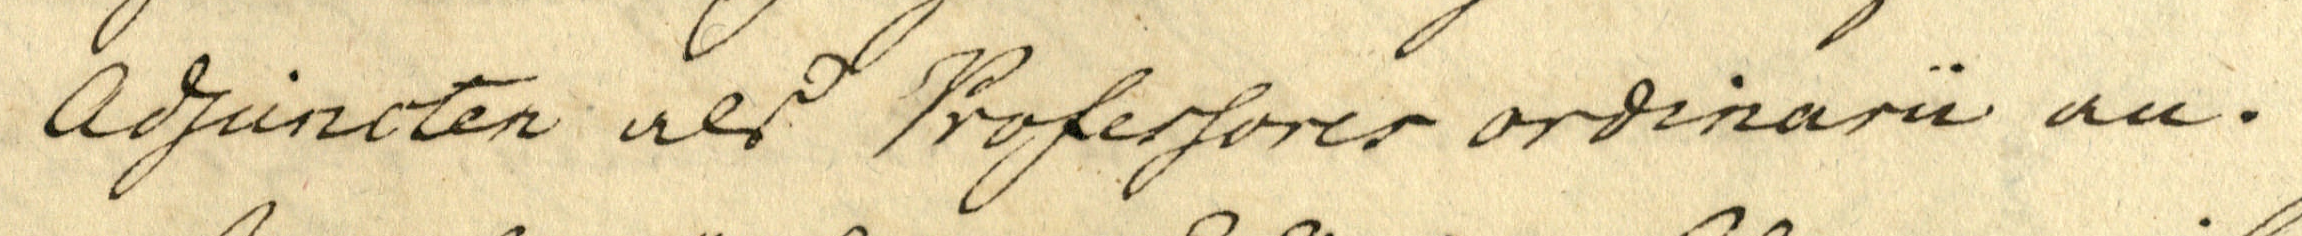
Adjuncten als Professores ordinarii an¬
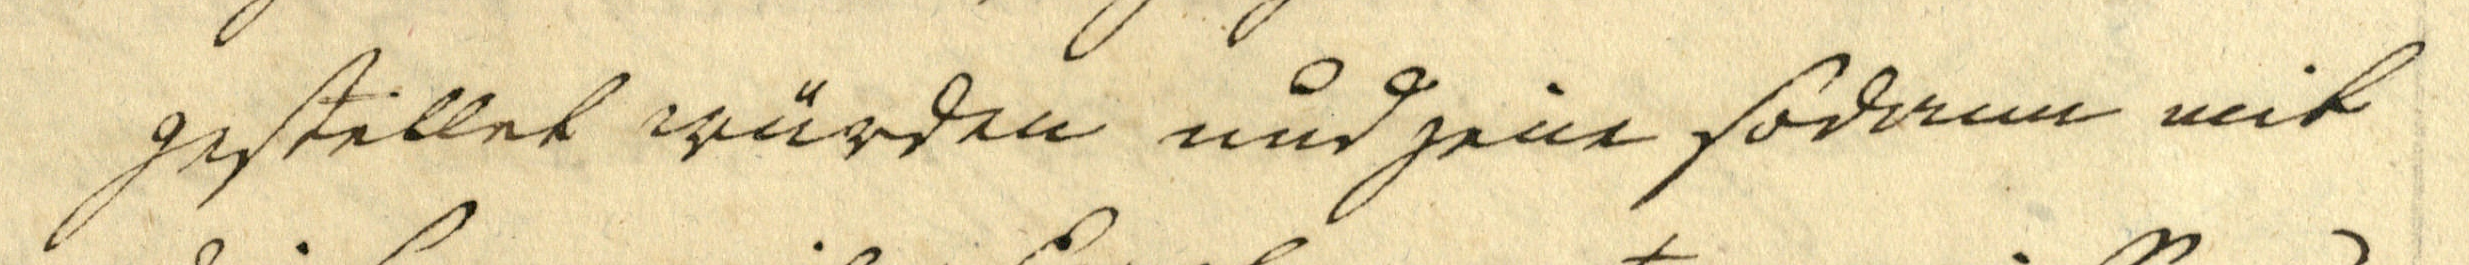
gestellet würden und eine sodann mit
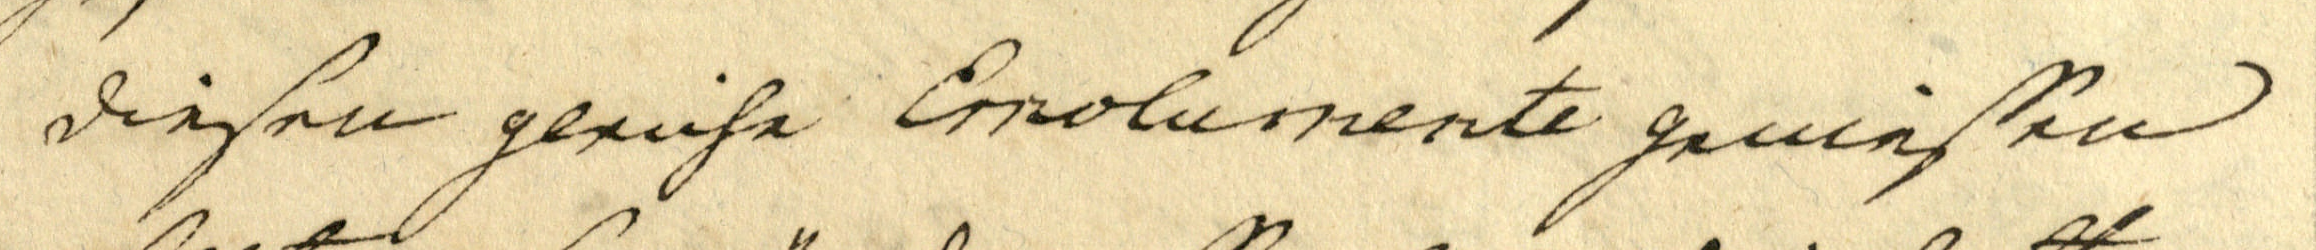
diesen gleiche Emolumente geniessen
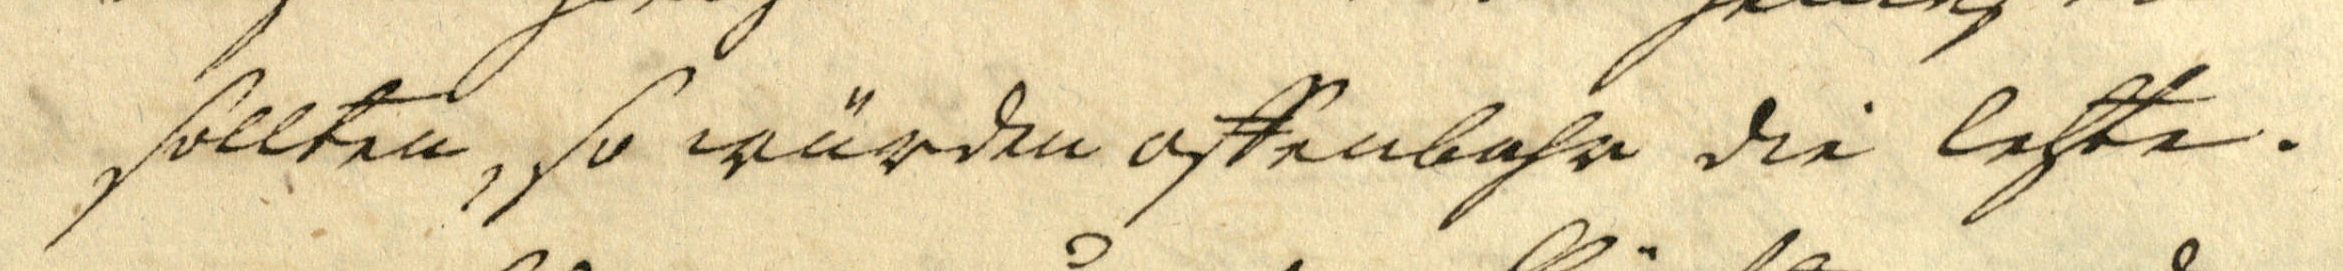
sollten, so würden offenbahr die letzte¬
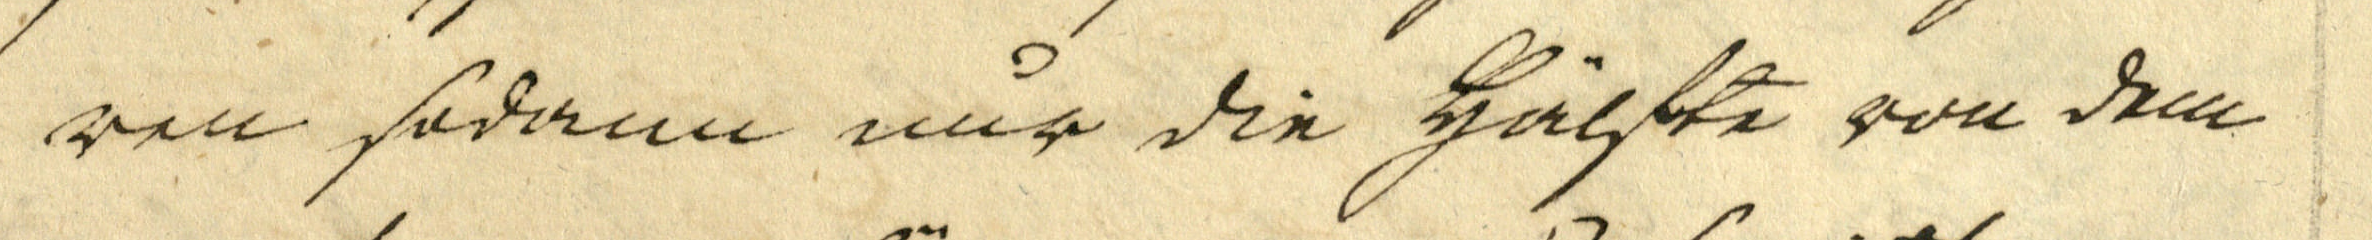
ren sodann nur die Hälfte von dem
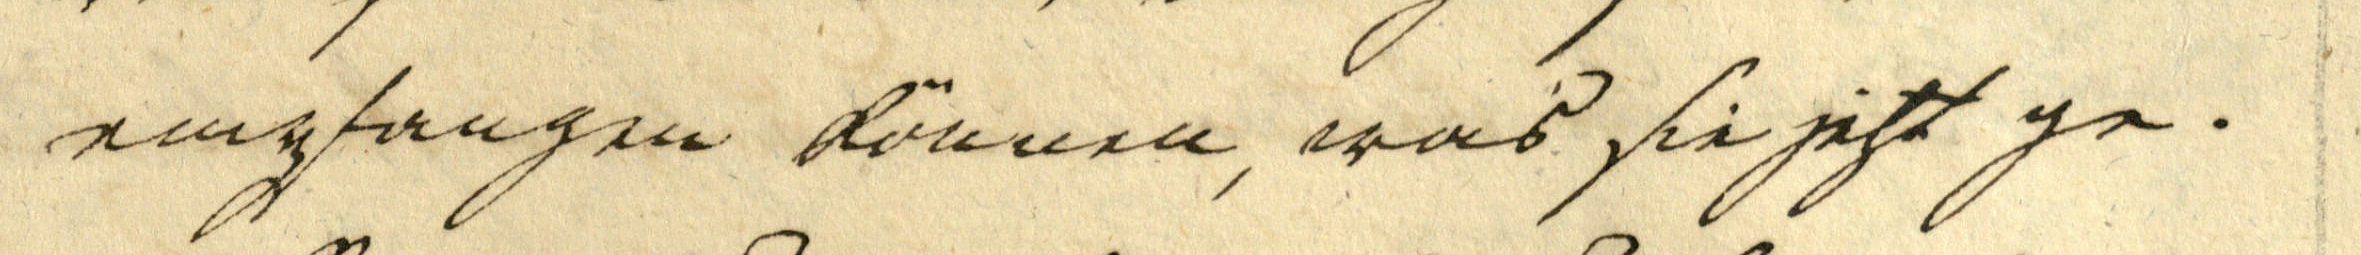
empfangen können, was sie jetzt ge¬
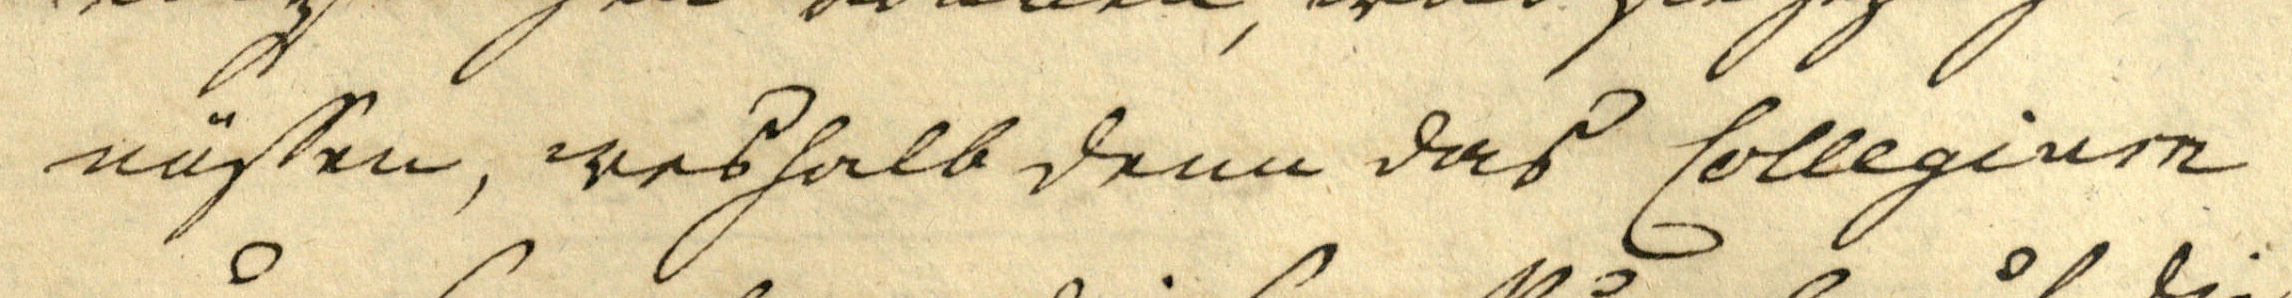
nüssen, weshalb denn das Collegium
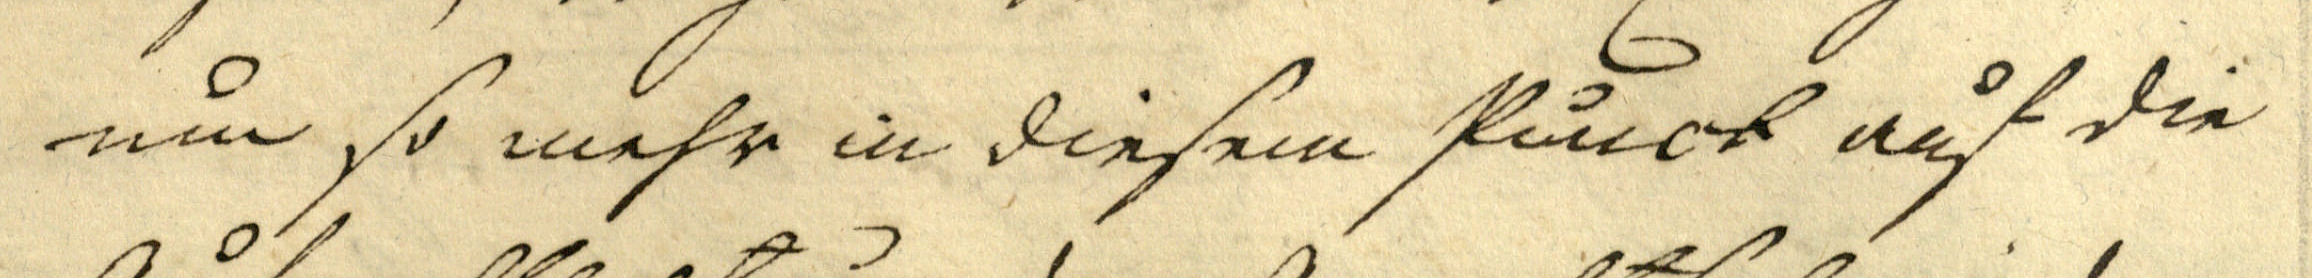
um so mehr in diesem Punct auf die
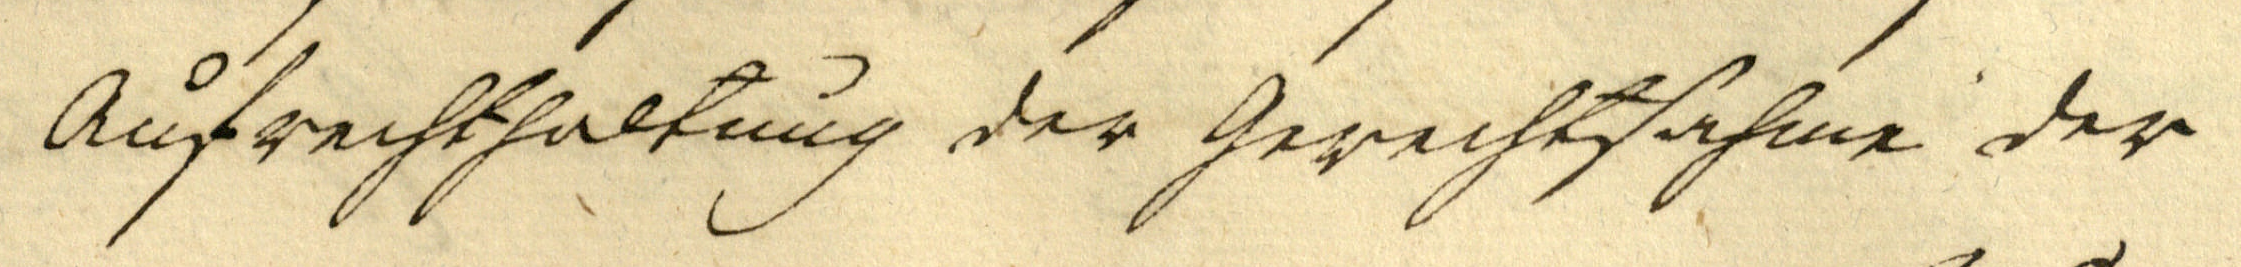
Aufrechthaltung der Gerechtsahme der
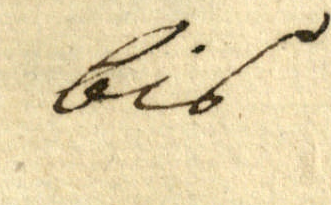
bis
